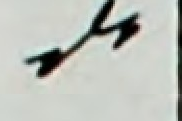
Do
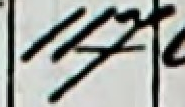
117
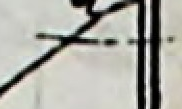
7
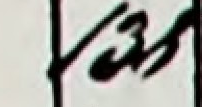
138
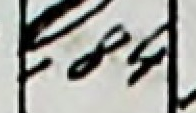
0,84
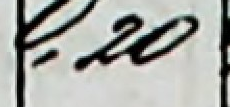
0,20
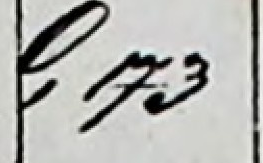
0,173
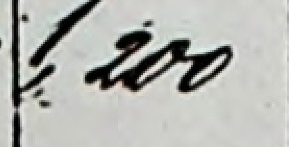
1,200
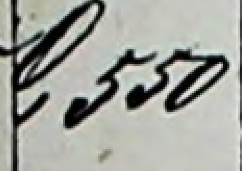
0,550
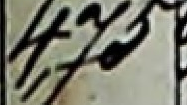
4,75
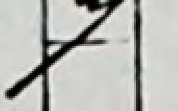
7
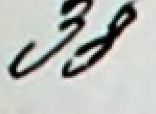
38
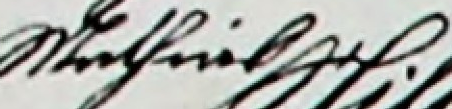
Mathias Joh.
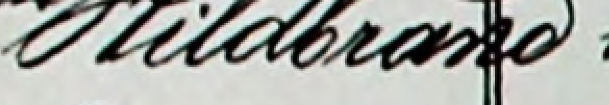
Hildbrand
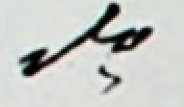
Do
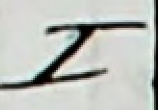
I
